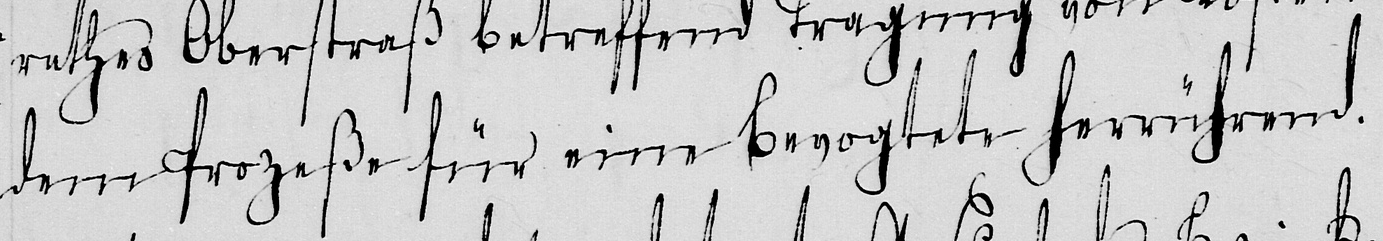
dem Prozeße für eine Bevogtete herrührend.
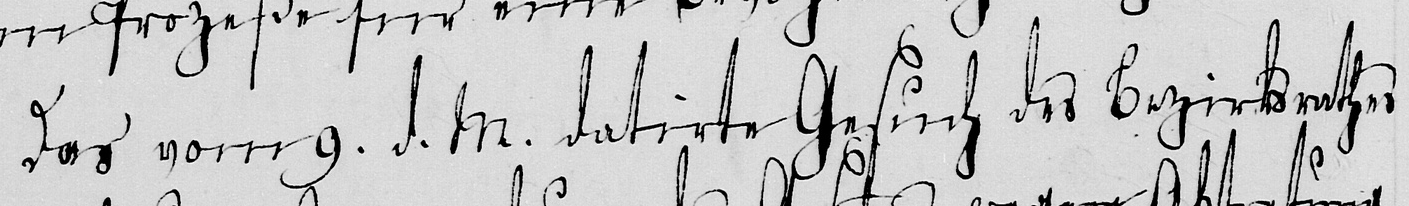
Das vom 9. d. M. datirte Gesuch des Bezirksrathes
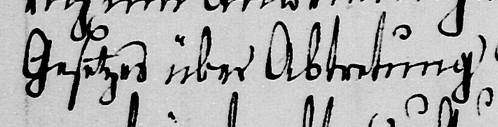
Gesetzes wegen Abtretung
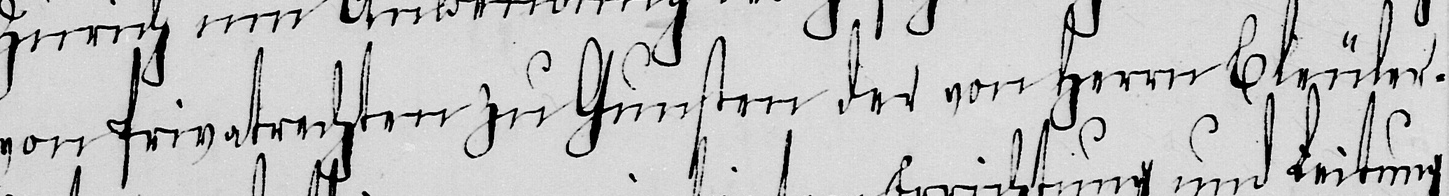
von Privatrechten zu Gunsten der von Herrn Bleule¬
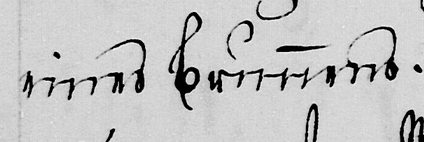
eines Brunnens.
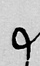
c.)
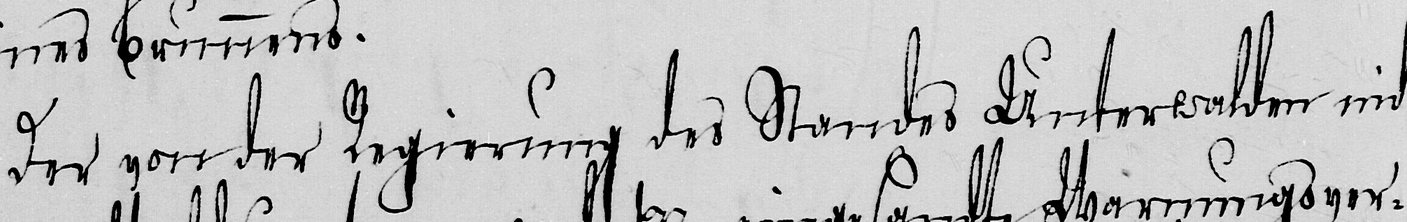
Der von der Regierung des Standes Unterwalden nid
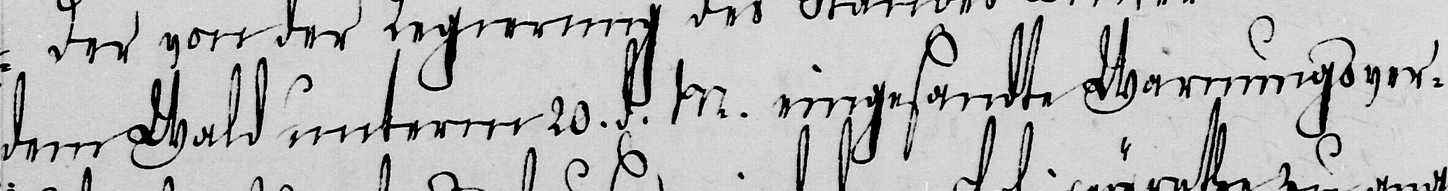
dem Wald unterm 20. d. M. eingesandte Warnungsver¬
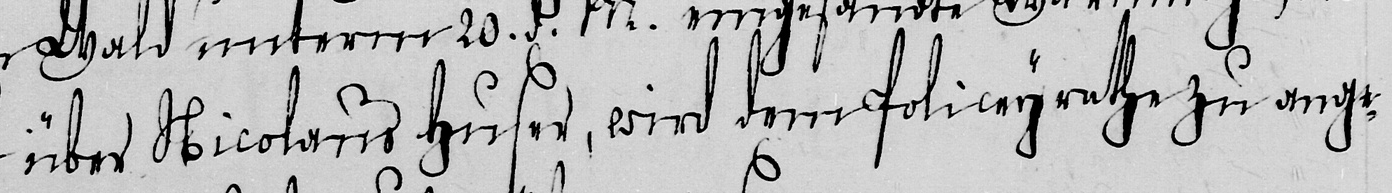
über Niclaus Huser, wird dem Policeyrathe zu ange¬
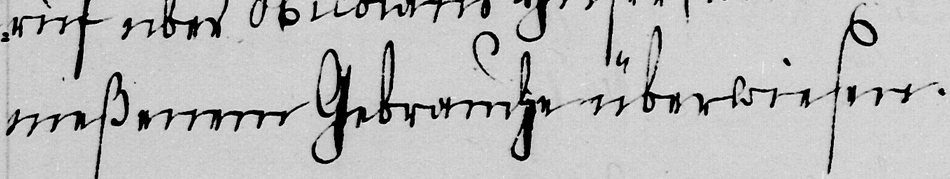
meßenem Gebrauche überwiesen.
